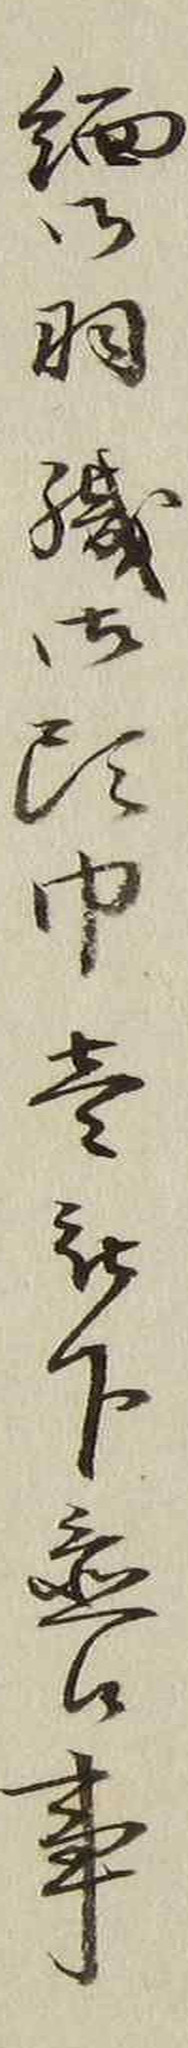緬御羽織御頭巾壱被下置候事
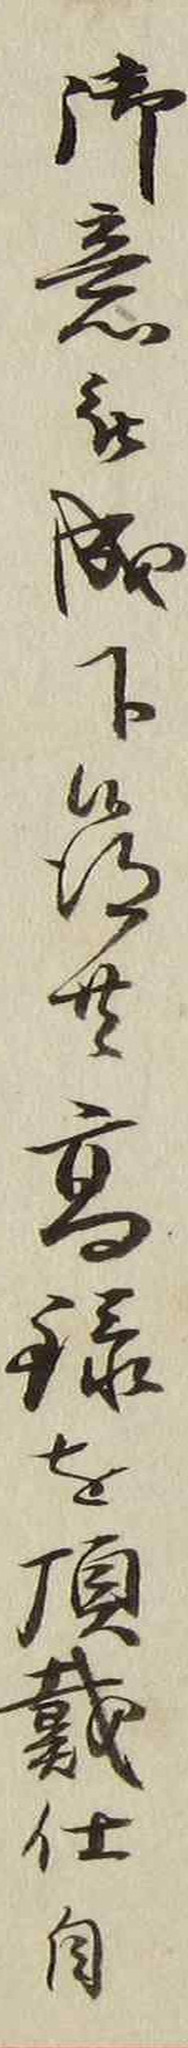御意被成下候得共高禄を頂戴仕自
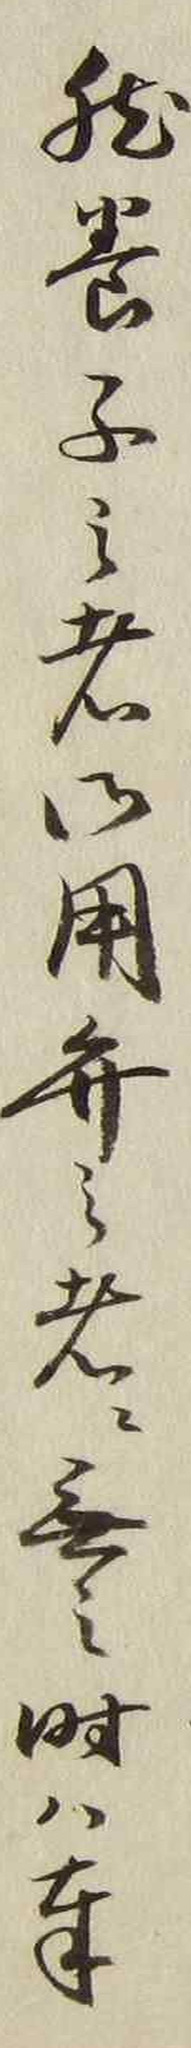然養子之者御用弁之者に無之時は奉
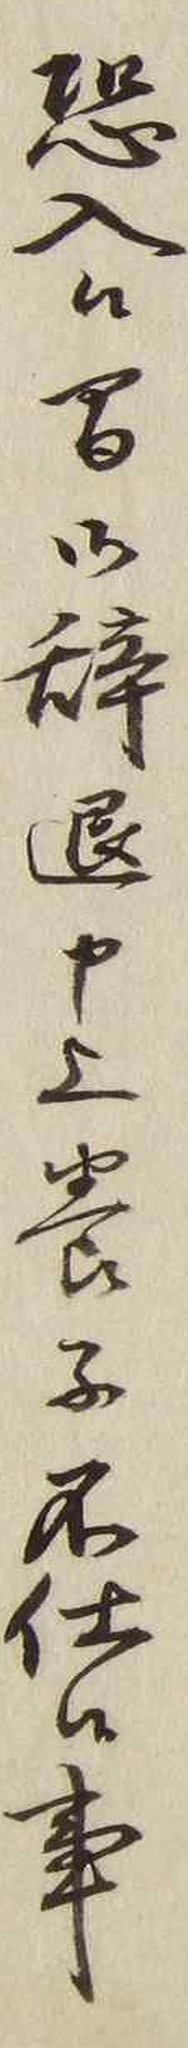恐入候間御辞退申上養子不仕候事

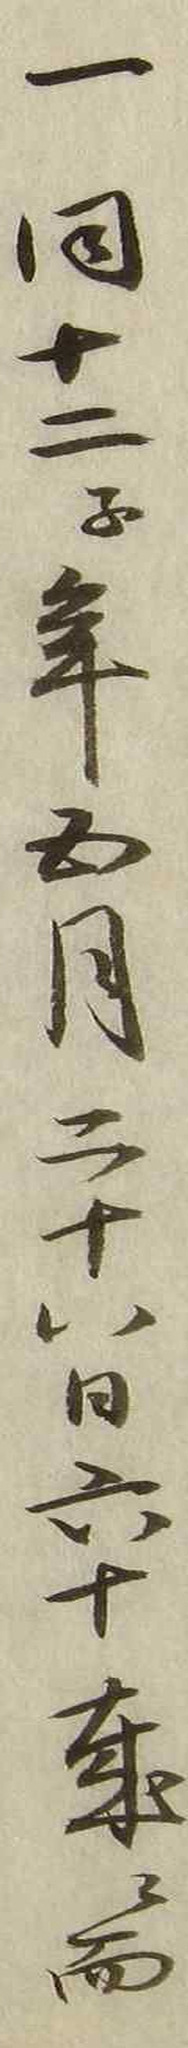一同十二年子年五月二十八日六十歳に而
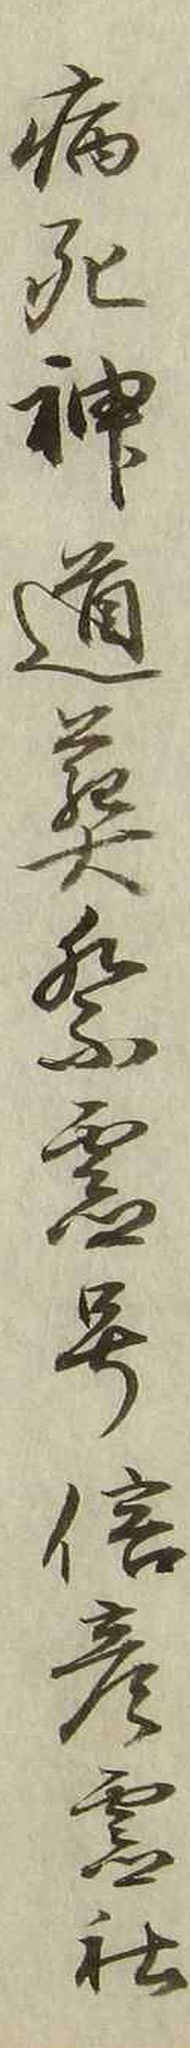病死神道葬祭霊号信彦霊社
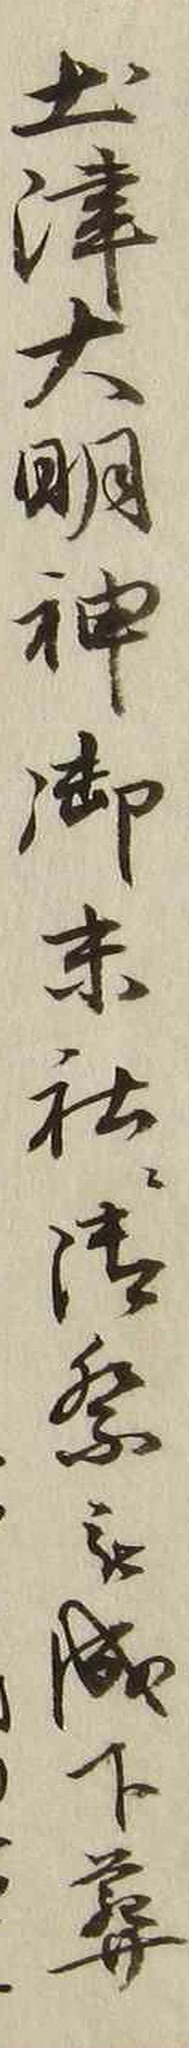土津大明神御末社に御祭被成下葬
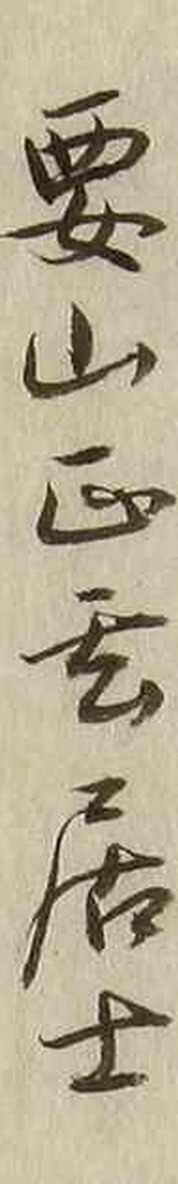要山正玄居士
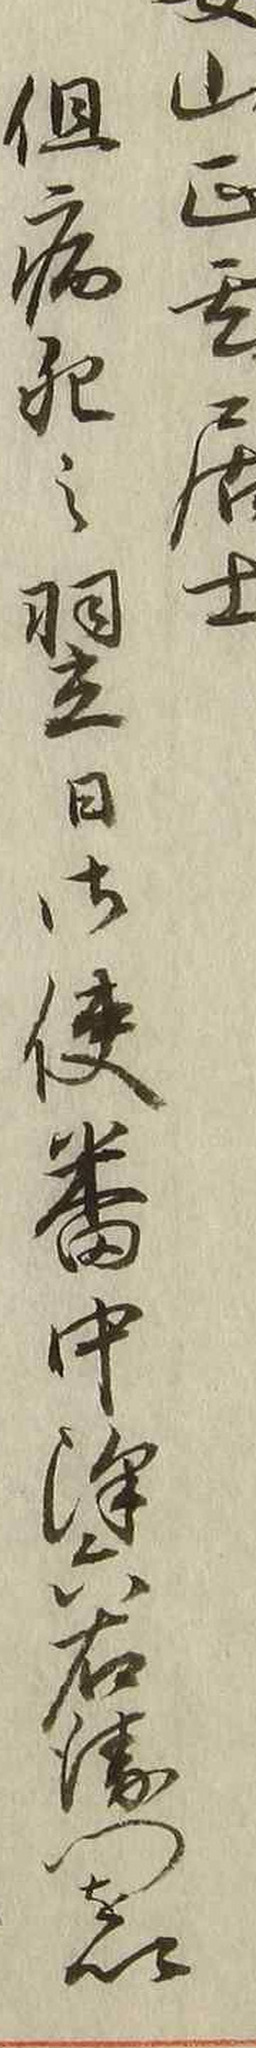但病死之翌日御使番中沢六右衛門を以
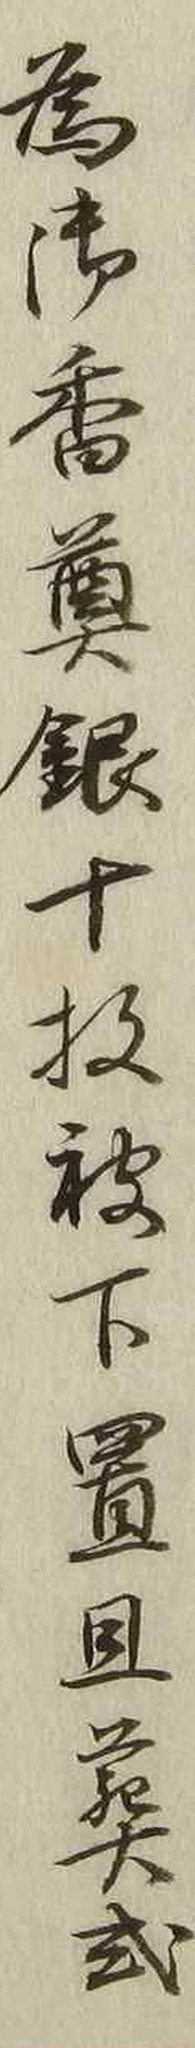為御香奠銀十枚被下置且葬式
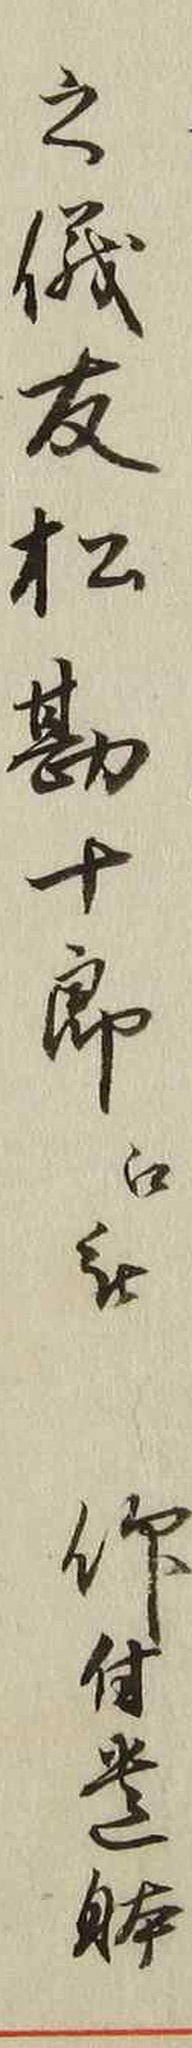之儀友松勘十郎江被仰付遺体
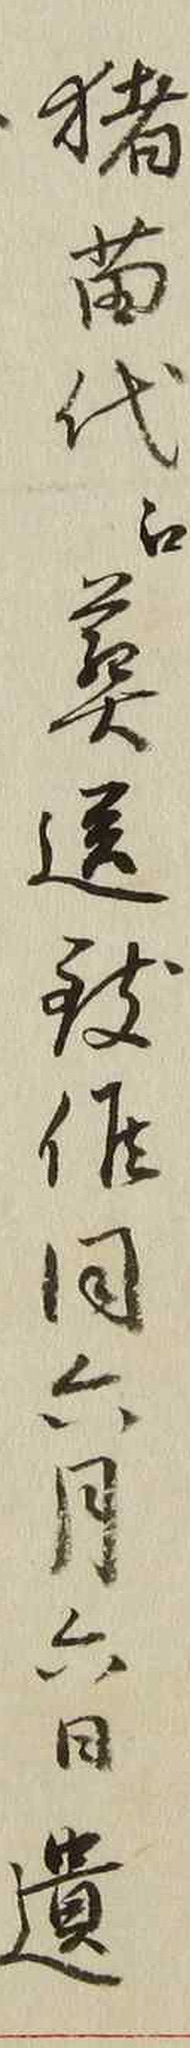猪苗代江葬送致候同六月六日遺
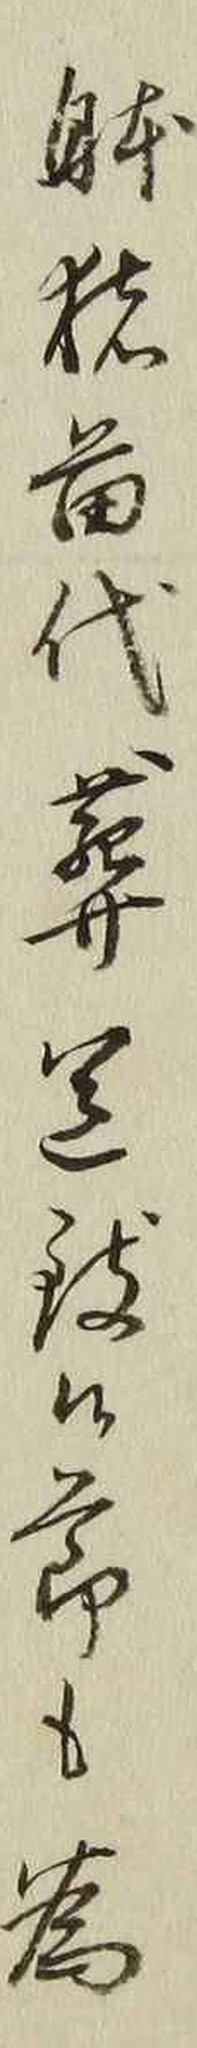体猪苗代へ葬道致候節も為
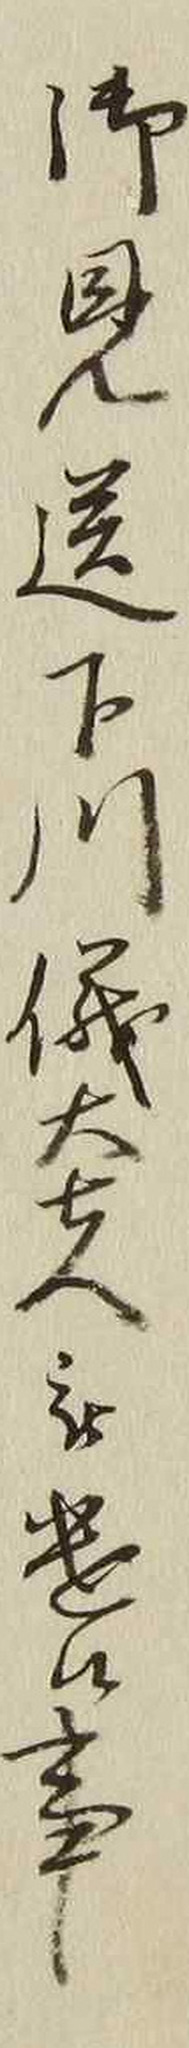御見送下川儀太夫被遣候事
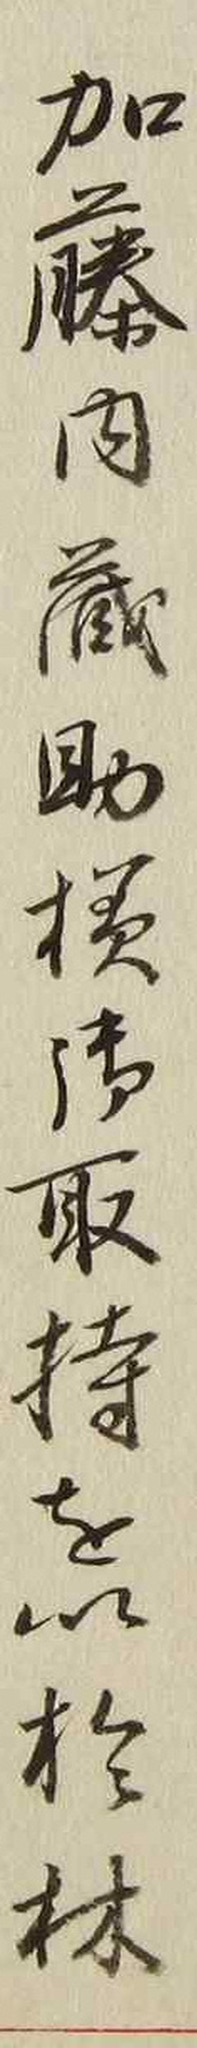加藤内蔵助様御取持を以於林
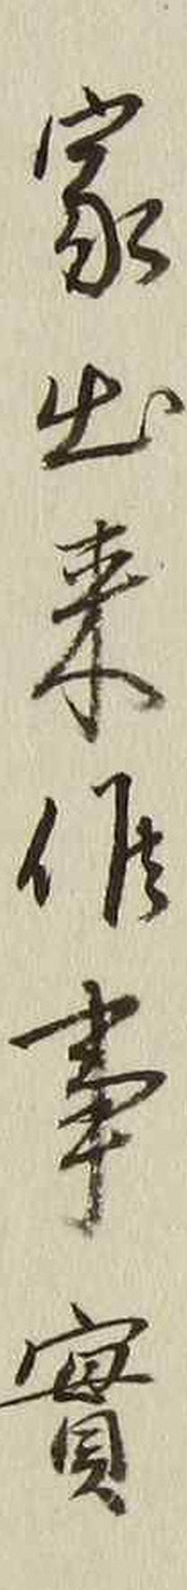家出来候事実
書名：諸士系譜　巻之125　た之部1
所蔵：会津若松市立会津図書館
